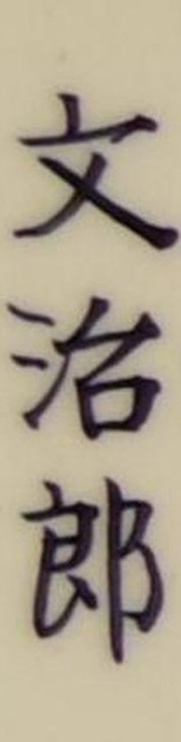文治郎
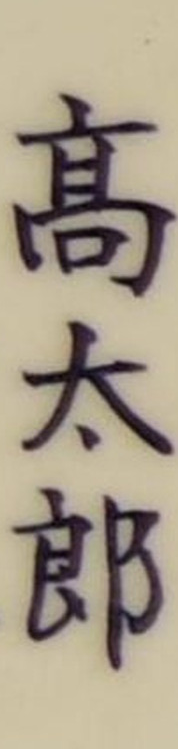高太郎

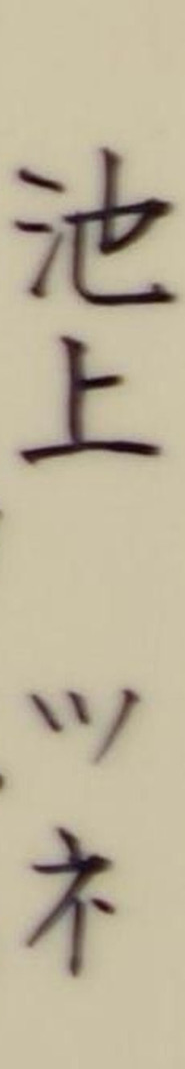池上ツネ
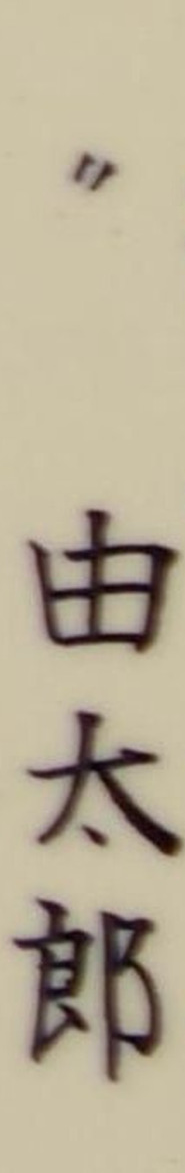由太郎
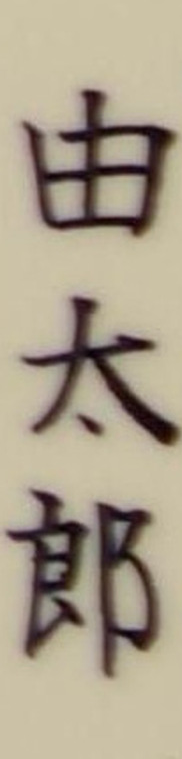由太郎
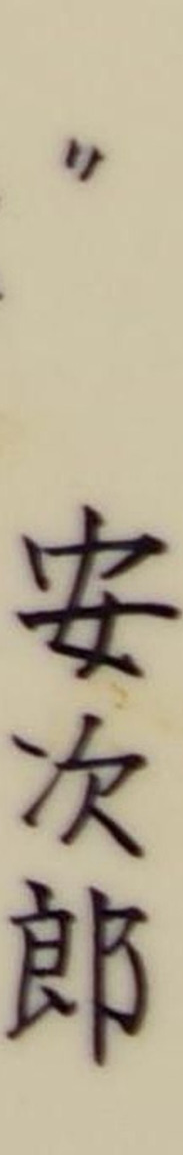安次郎
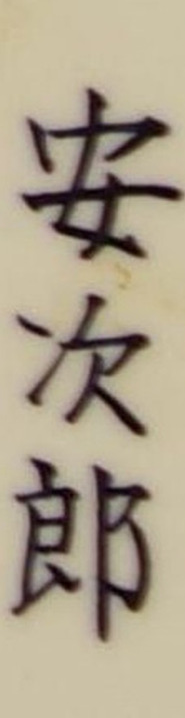安次郎
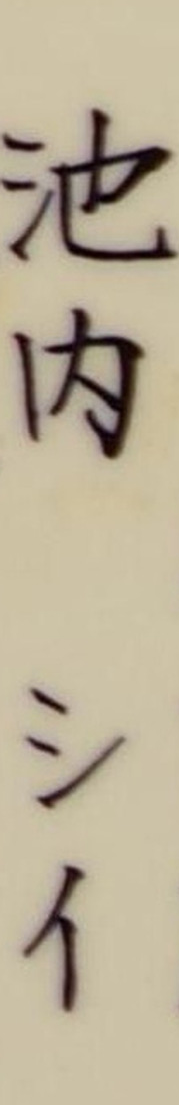池内シイ
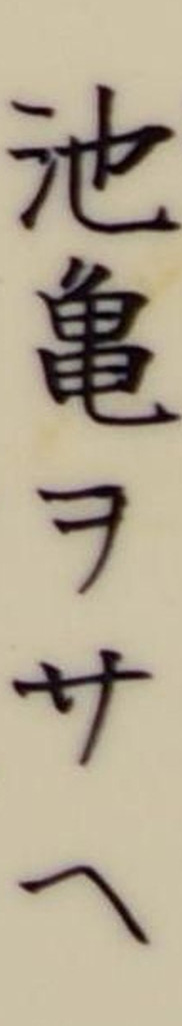池亀ヲサヘ
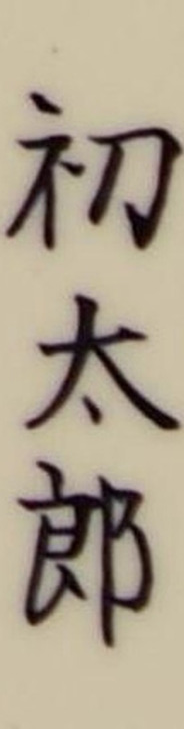初太郎
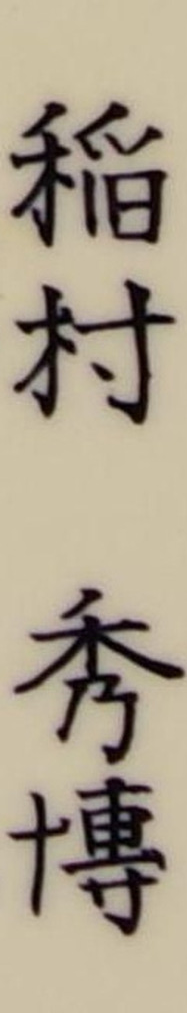稲村秀博
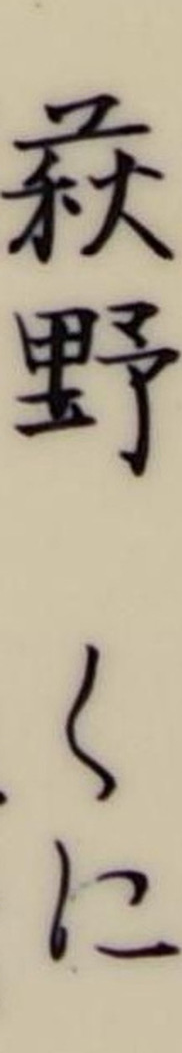萩野くに
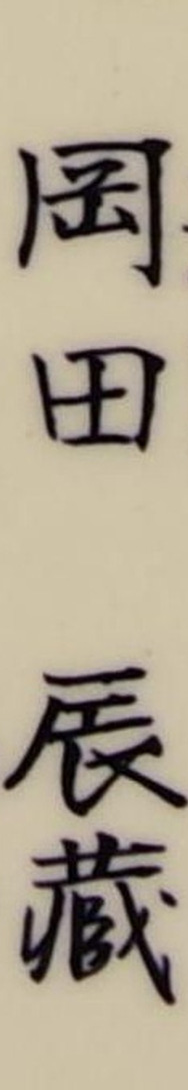岡田辰蔵
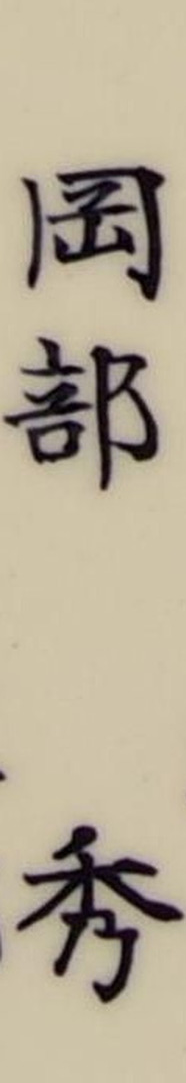岡部秀
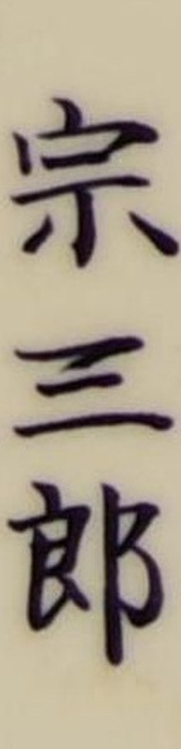宗三郎
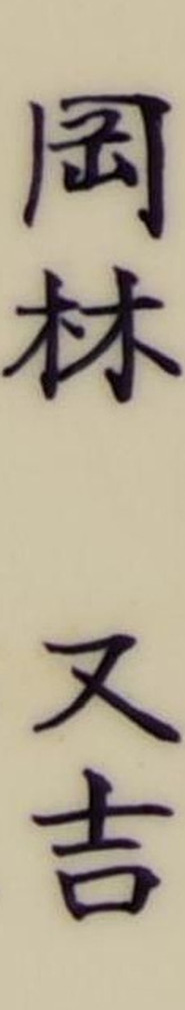岡林又吉
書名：E~L
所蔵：高野山金剛峯寺
